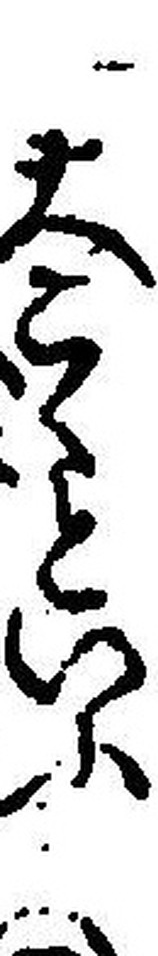大こくといふ
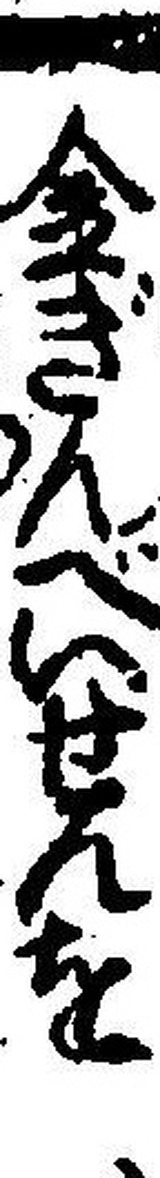きんぎんべいせんを
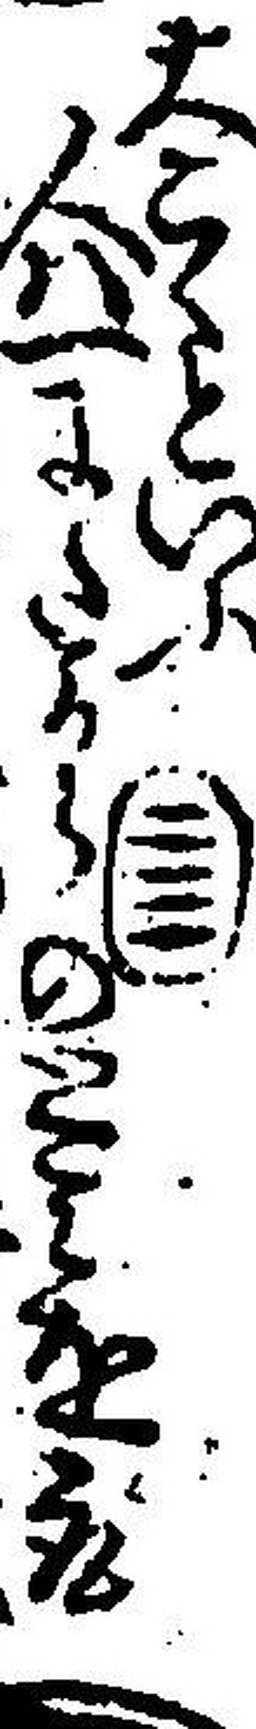人は一にたからのとみを取
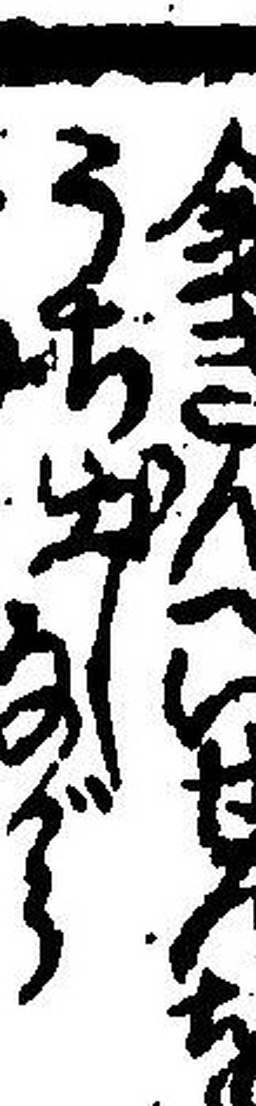うち出しながら
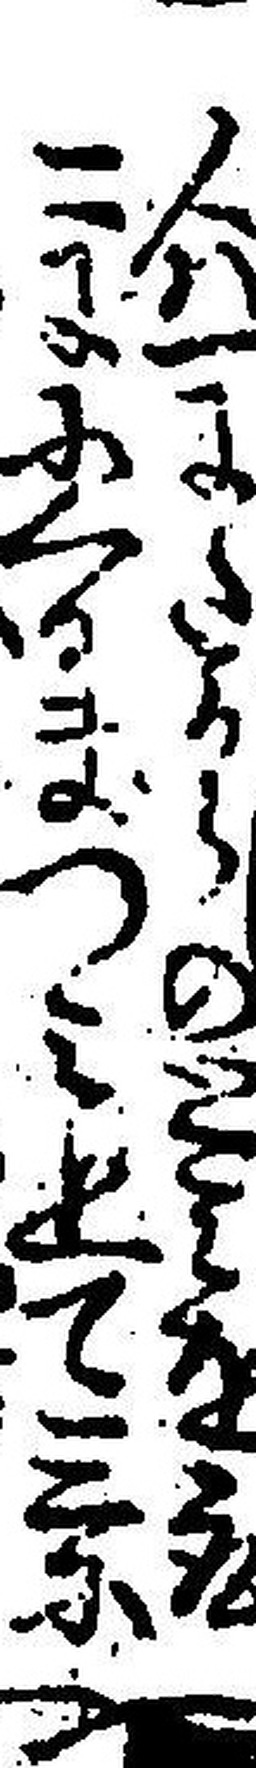二ににくるまつみ上て三に
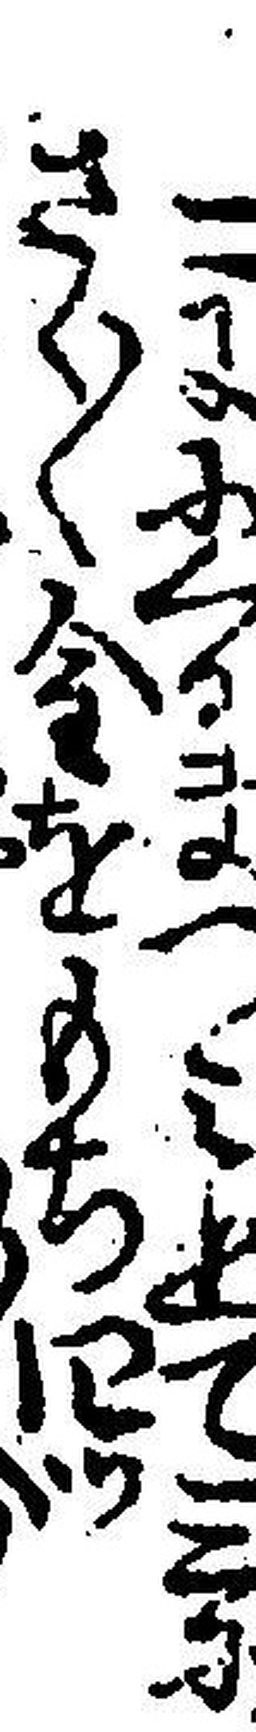さく〳〵金をもち四つ
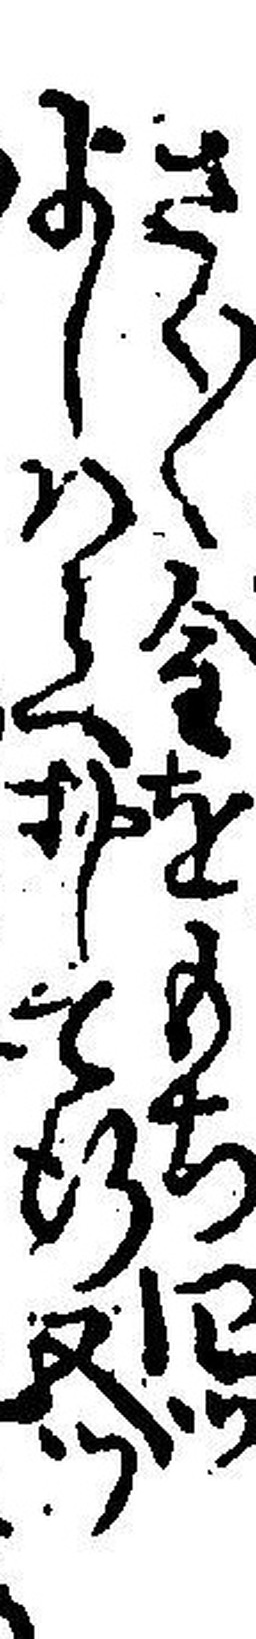よしはらへおして行五つ
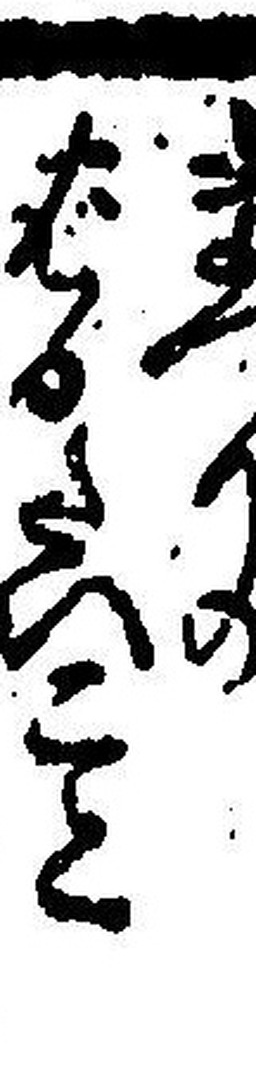はるたいこと
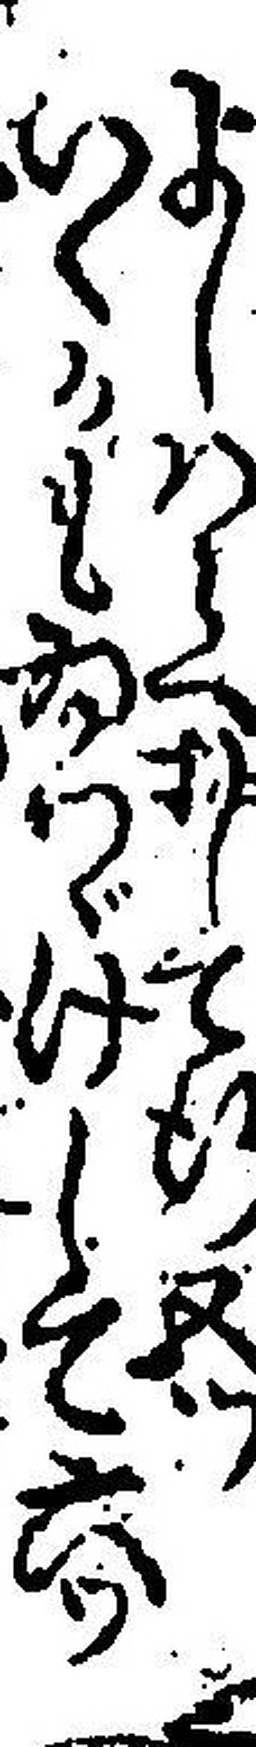いゝかもゐつゞけして六つ
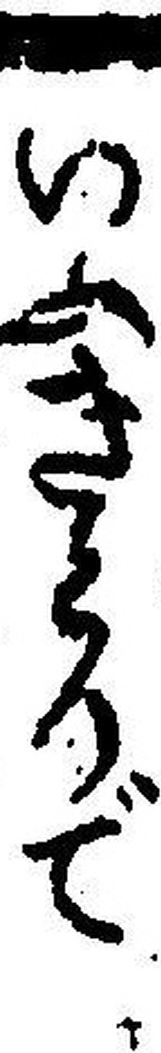いふきとりで
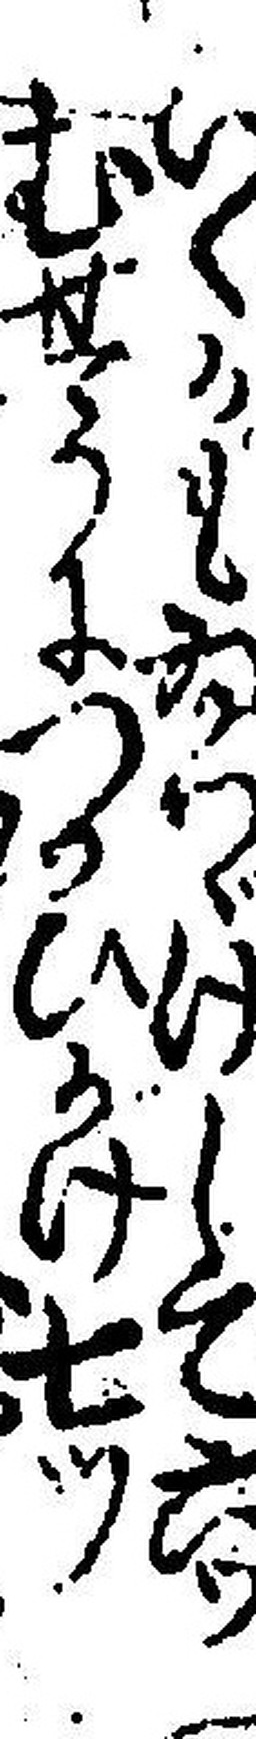むせうにつかひかけ七つ
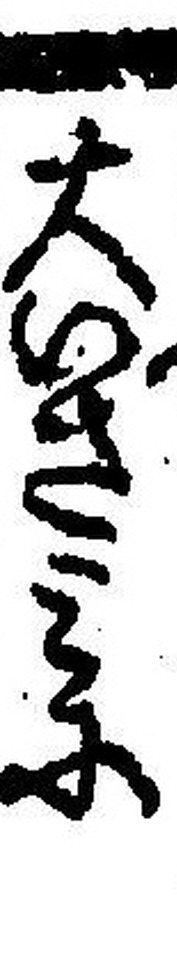大いきみに
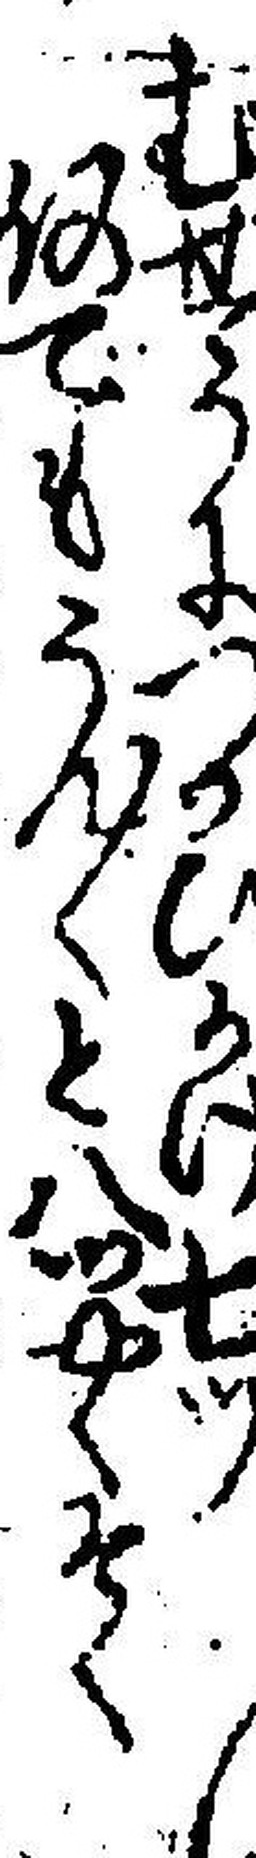何てもうん〳〵と八つやくそく
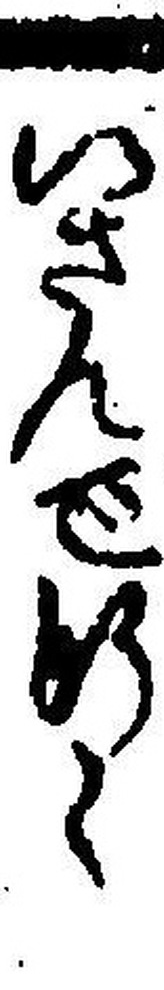いさんで行く
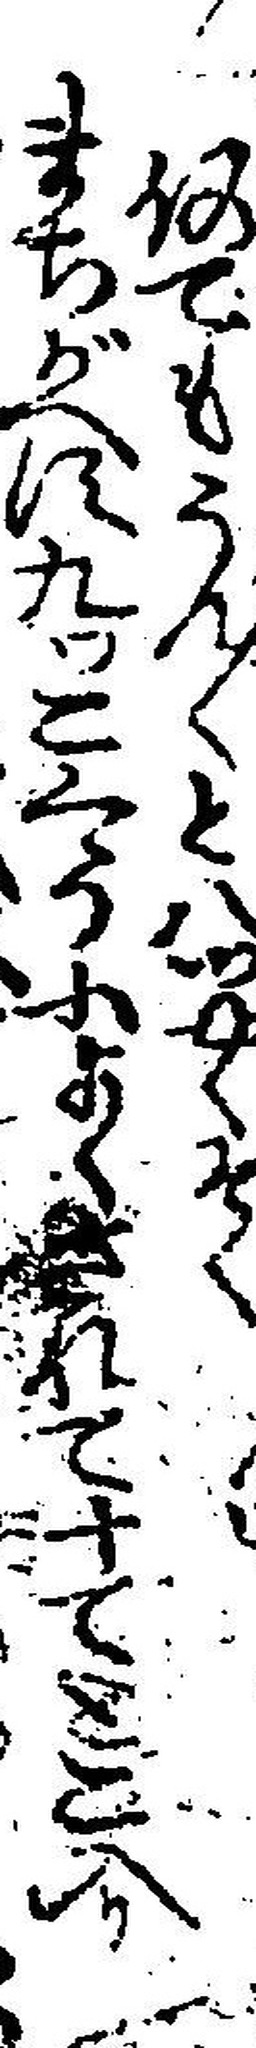まちがへす九つこくうによくされて十てとこ入り
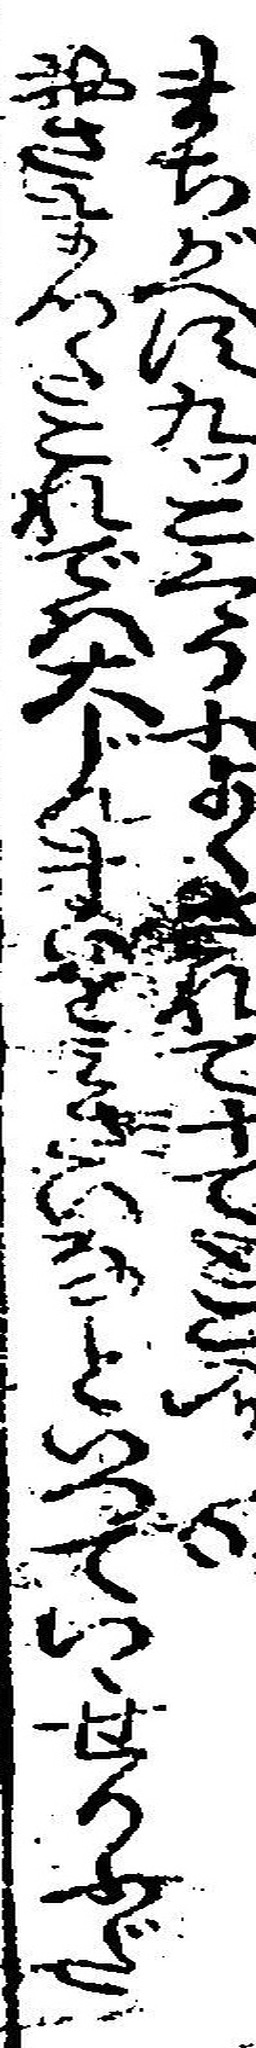おさまつたこれでは大じんまいをみさいなといつていゝせりふだ
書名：徳若水縁起金性 / 樹下石上作
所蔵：東京大学総合図書館 General Library in the University of Tokyo, JAPAN
